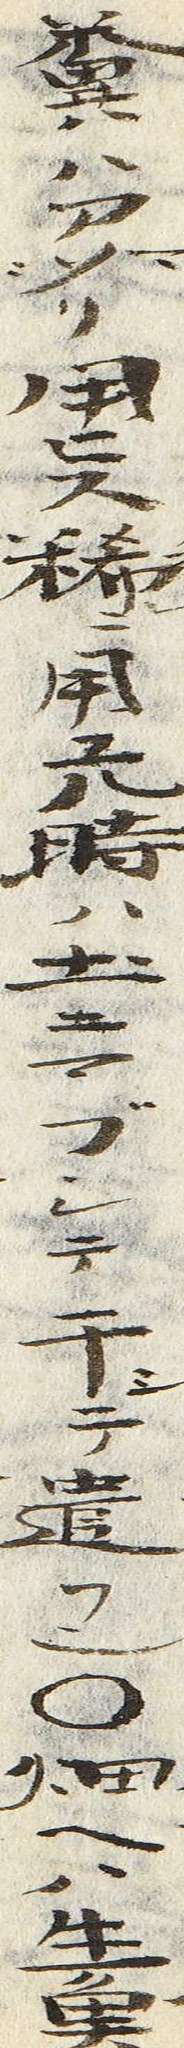糞ハアマリ用ヒスレニ用ユル時ハ土ニマブシテ干シテ遣フフ也〇畑へハ生魚
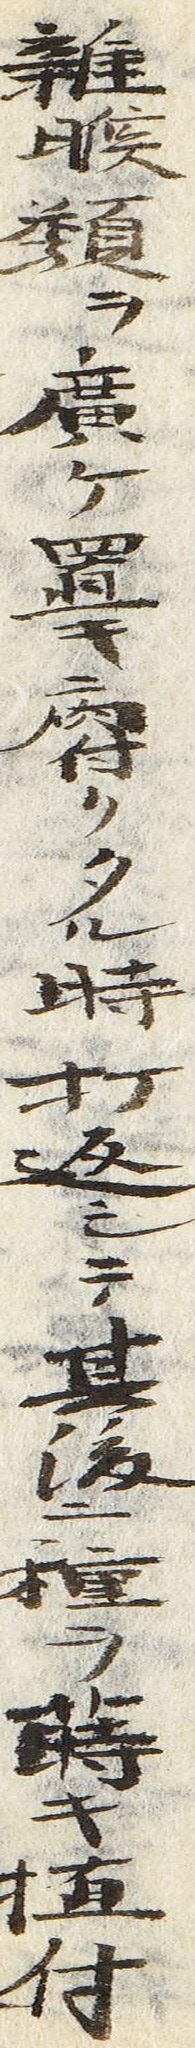雑類ヲ広ケ置キ腐リタル時打返シテ其後ニ種ヲ蒔キ植付
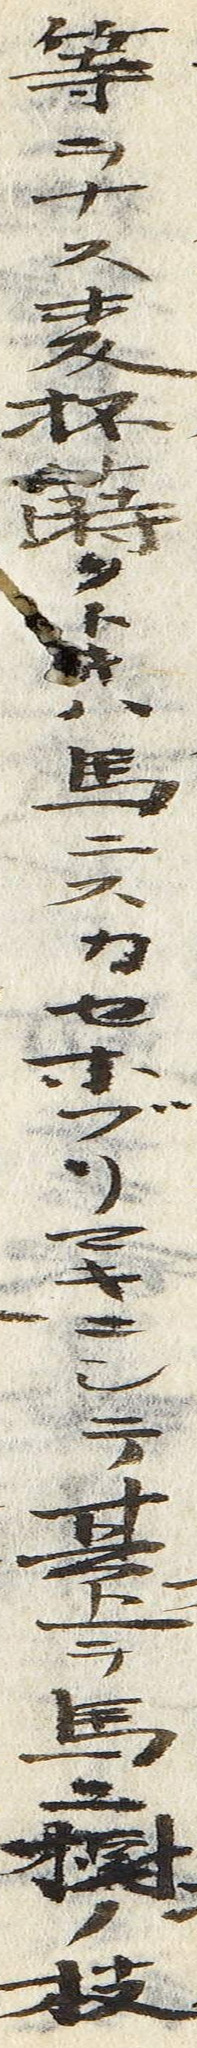等ヲナス麦抔蒔クトキハ馬ニスカセホブリマキニシテ其上ヲ馬ニ樹ノ枝
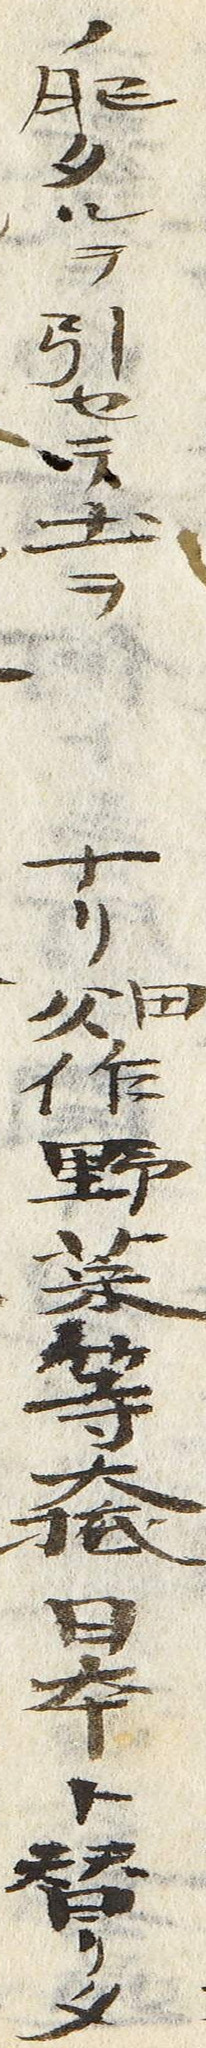ノ肥タルヲ引セテ土ヲナリ畑作野菜等大抵日本ト替リタ
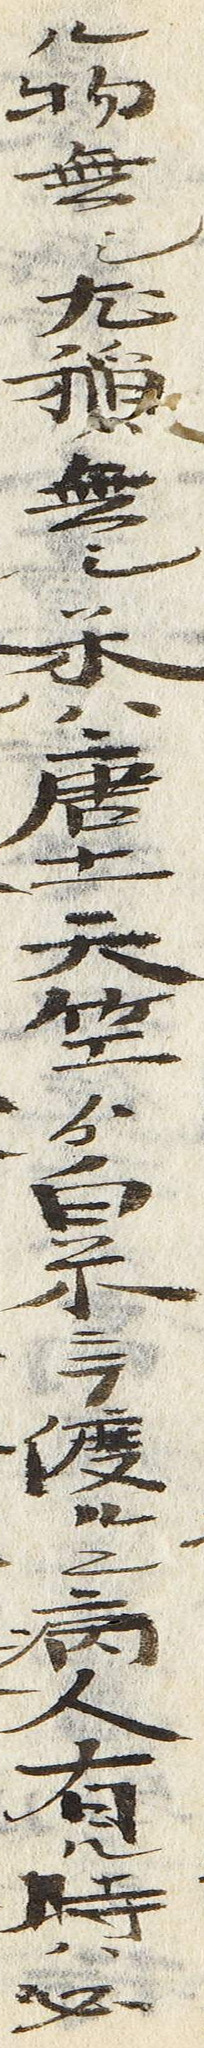ル物無シ尤稲無シ米ハ唐土天竺ゟ白米ニテ渡ル也病人有ル時ハ必
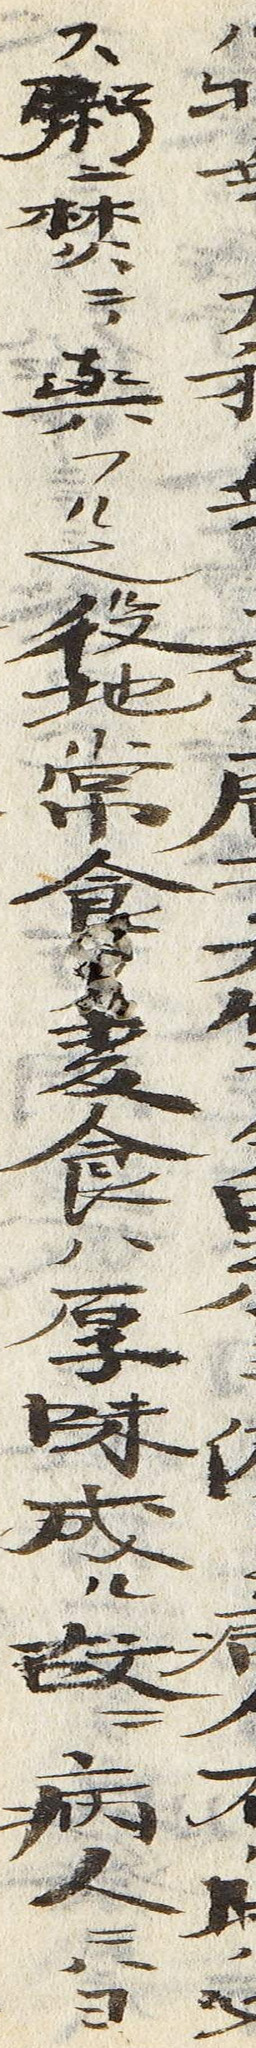ス粥ニ焚テ与フル也役地常食ノ麦食ハ厚味成ル故ニ病人ニハヨ
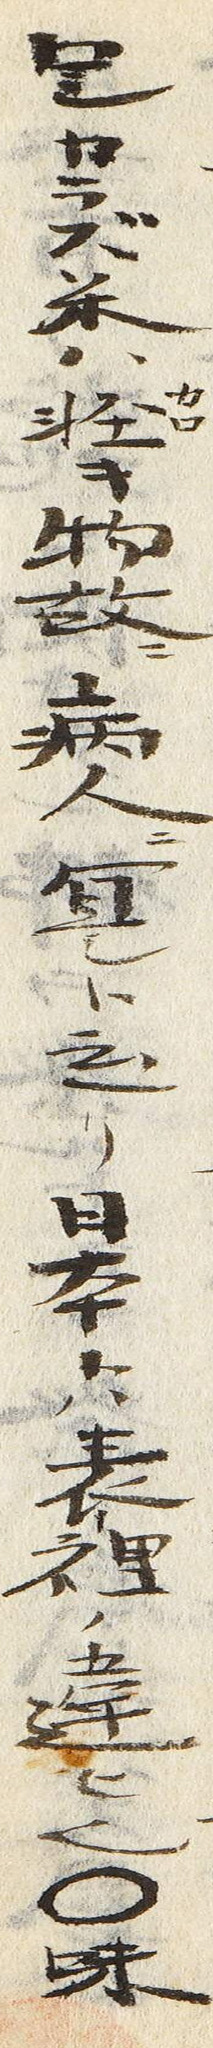ロシカラズ米ハ軽キ物故ニ病人ニ宜シト云ヘリ日本トハ表裡ノ違ヒ也〇味
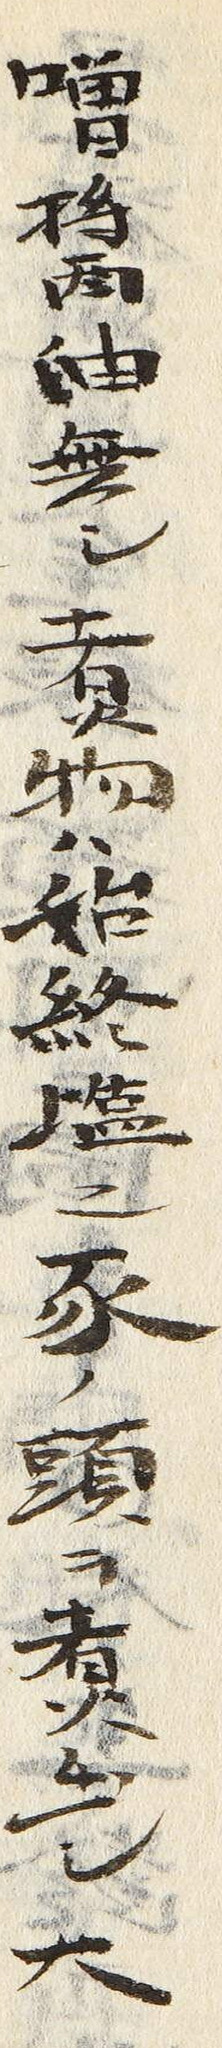噌醤油無シ煮物ハ始終塩也豚ノ頭ヲ煑出シ大定め
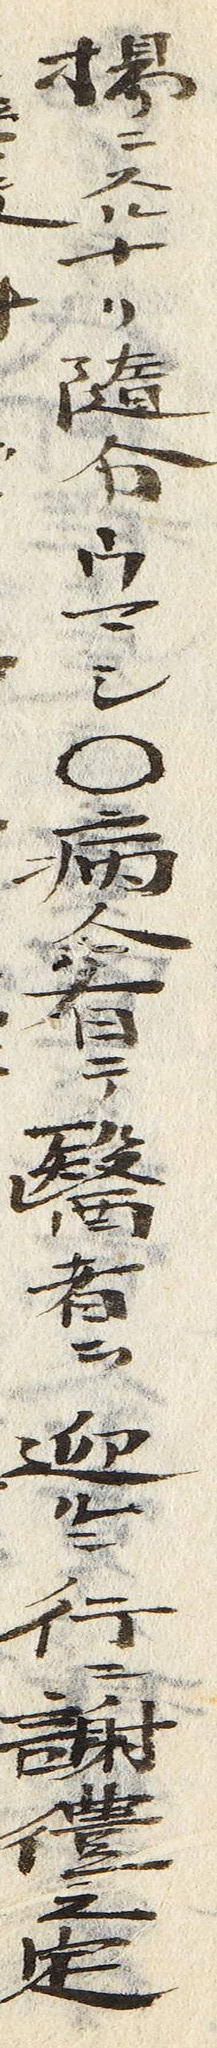揚ニスルナリ随分ウマシ〇病人有テ医者ヲ迎ルニ行ニ謝礼之定
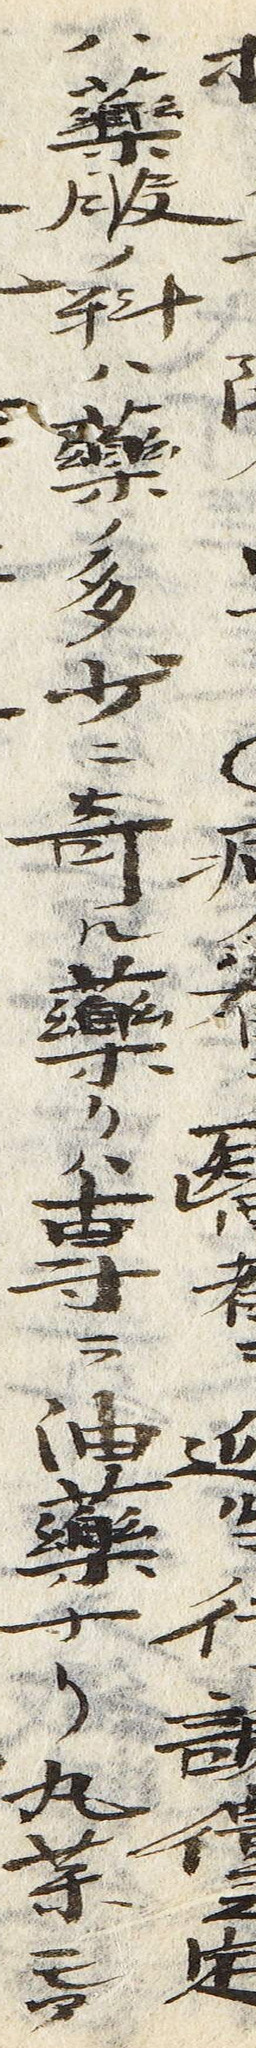ハ薬服ノ科ハ薬ノ多少ニ寄ル薬リハ専ラ油薬ナリ丸薬モア
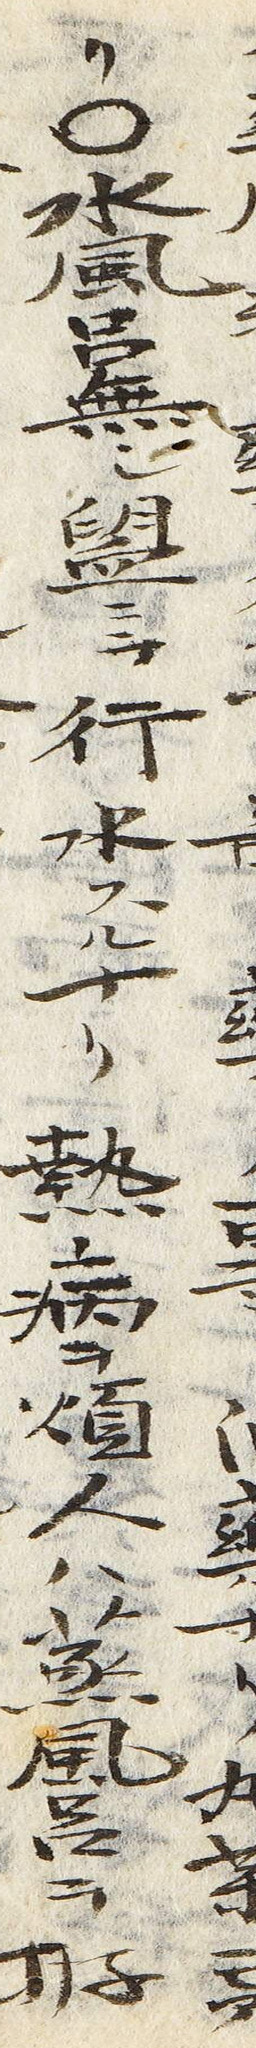リ〇水風呂無シ盥ニテ行水スルナリ熱病ヲ煩人は蒸風呂ヲ拵
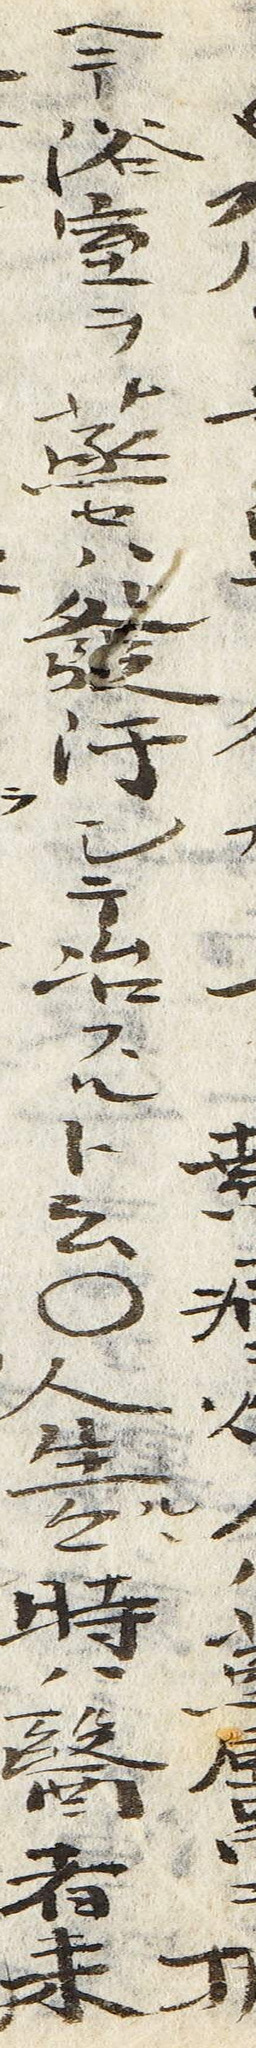ヘテ浴室ヲ蒸セハ発汗シテ治スルト云〇人生亡時ハ医者来
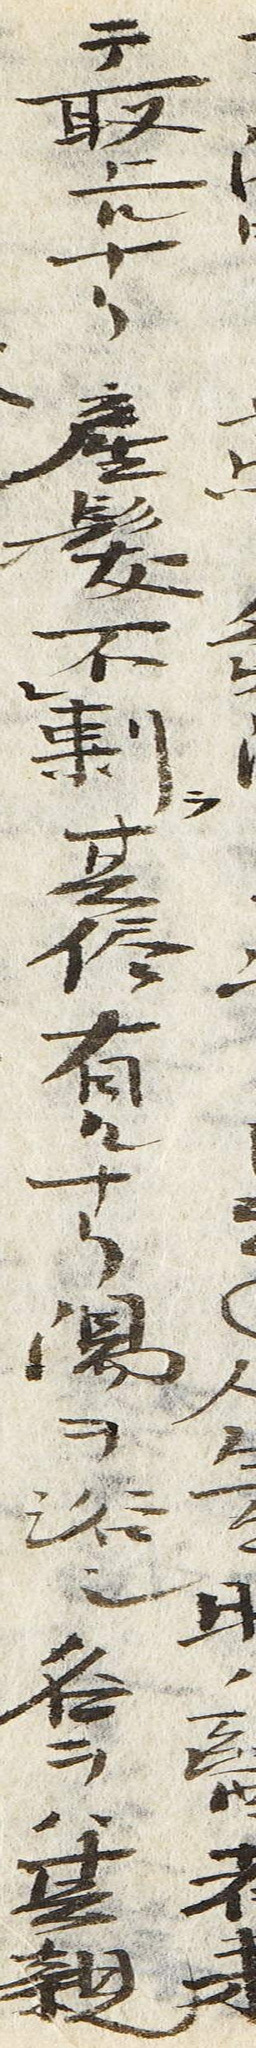テ取上ルナリ産髪不剃其侭有ルナリ湯ヲ浴シ各ラハ其親
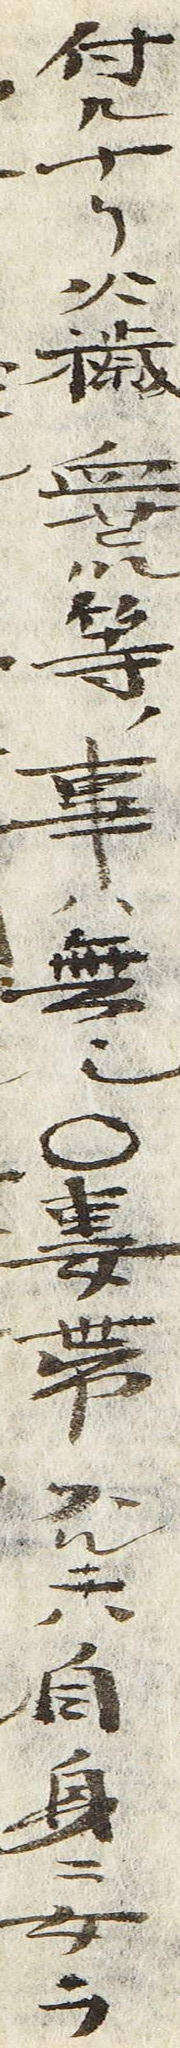付ルナリ火穢血荒等ノ事ハ無シ〇妻帯スルニハ自身ニ女ヲ
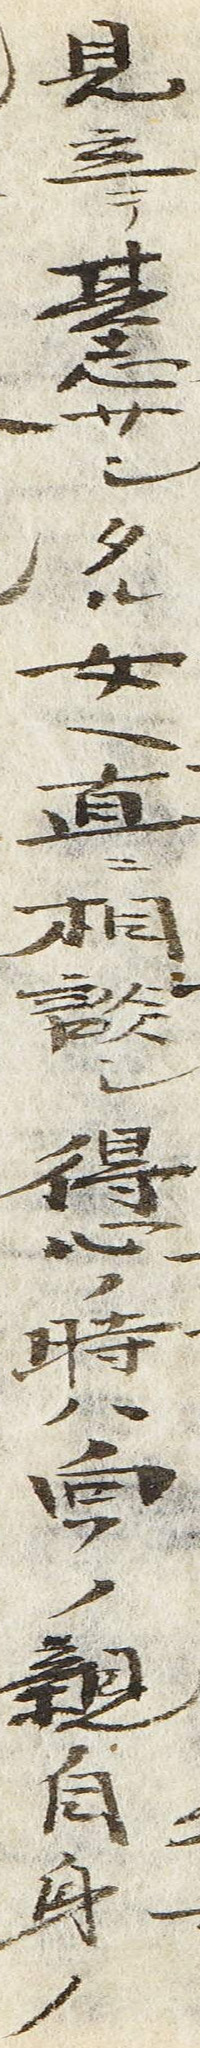見立テ其志サシタル女ヘ直ニ相談シ得心ノ時ハ向フノ親自身ノ
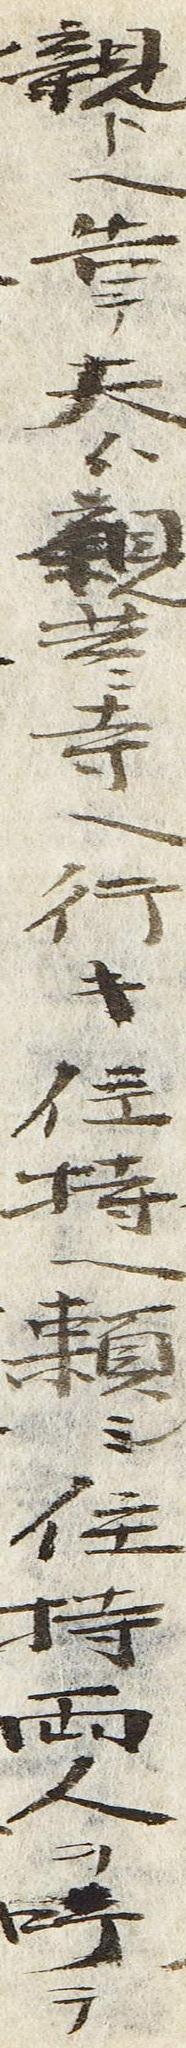親へ告テ夫ゟ親共ニ寺へ行キ住持へ頼ミ住持両人ヲ呼テ
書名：漂流記聞
